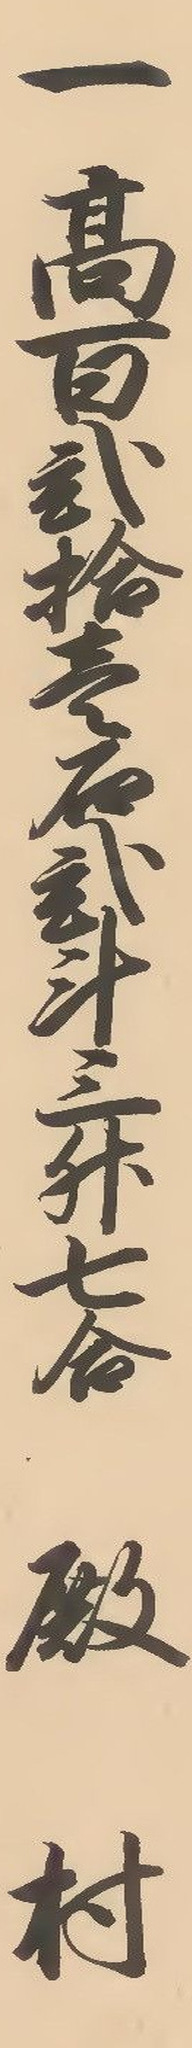一高百弐拾壱石弐斗三升七合殿村

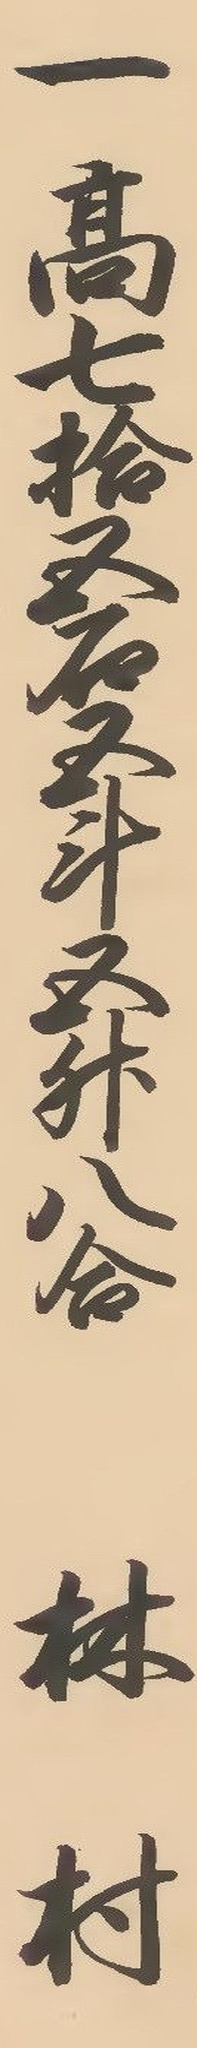一高七拾五石五斗五升八合林村
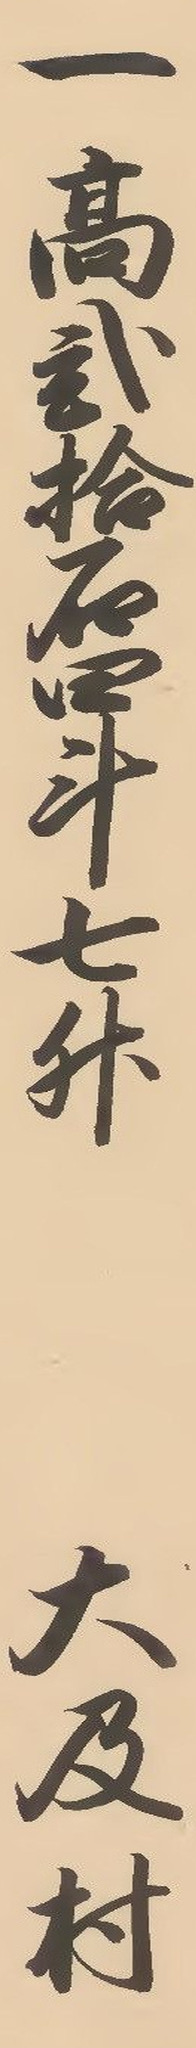一高弐拾石四斗七升大及村
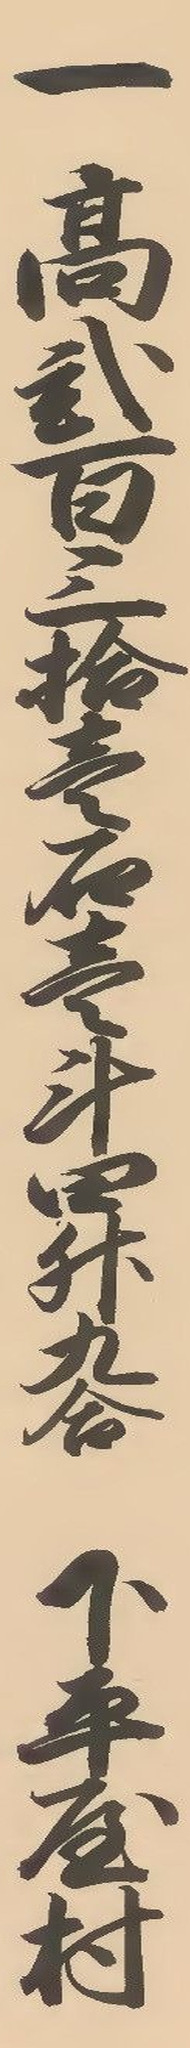一高弐百三拾壱石壱斗四升九合下平屋村
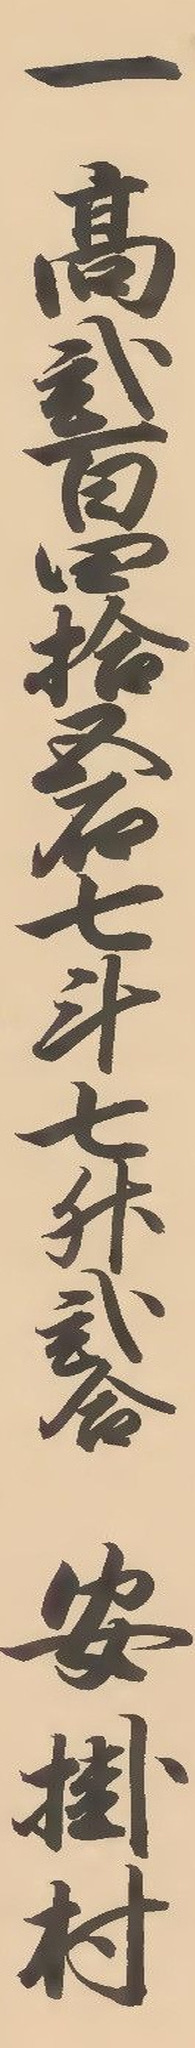一高弐百四拾五石七斗七升弐合安掛村
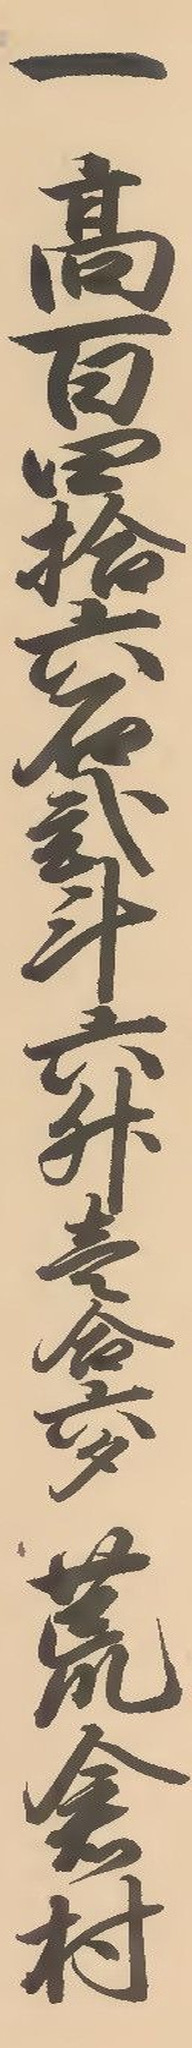一高百四拾六石弐斗六升壱合六勺荒倉村
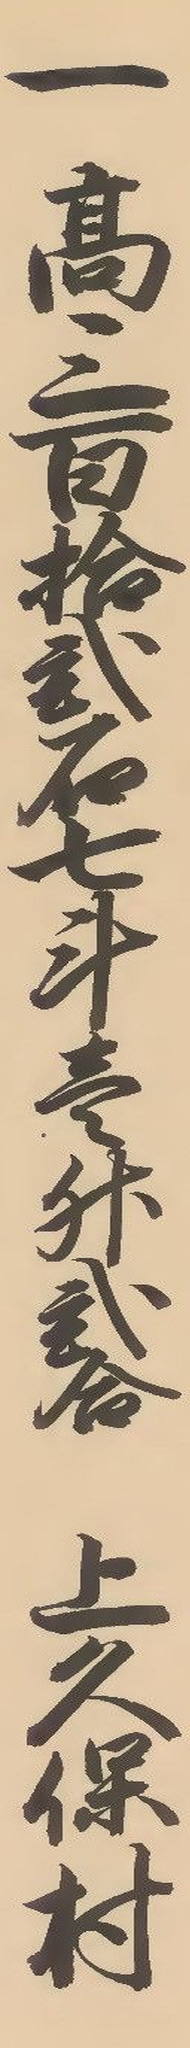一高三百拾弐石七斗壱升弐合上久保村
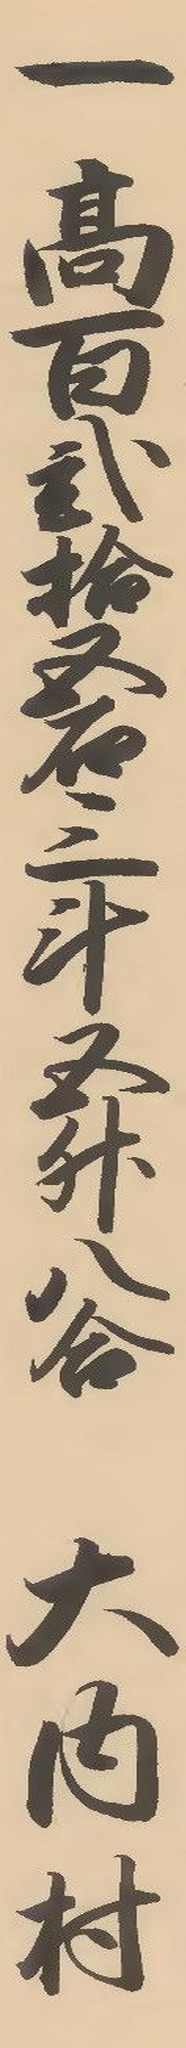一高百弐拾五石三斗五升八合大内村
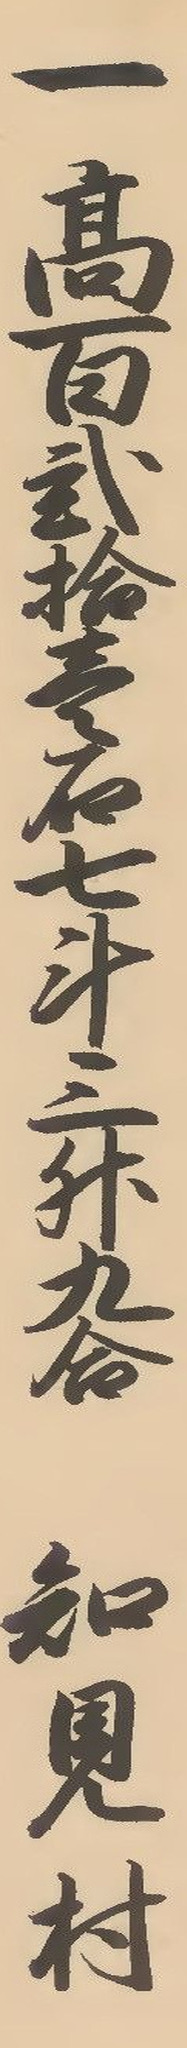一高百弐拾壱石七斗三升九合知見村

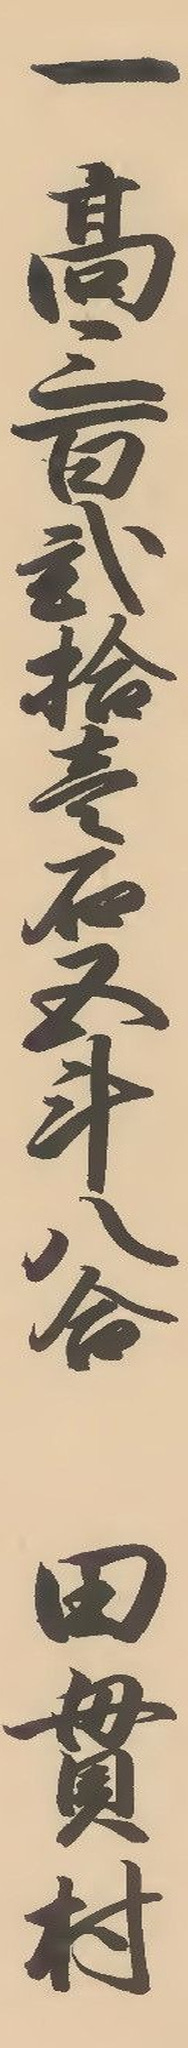一高三百弐拾壱石五斗八合田貫村
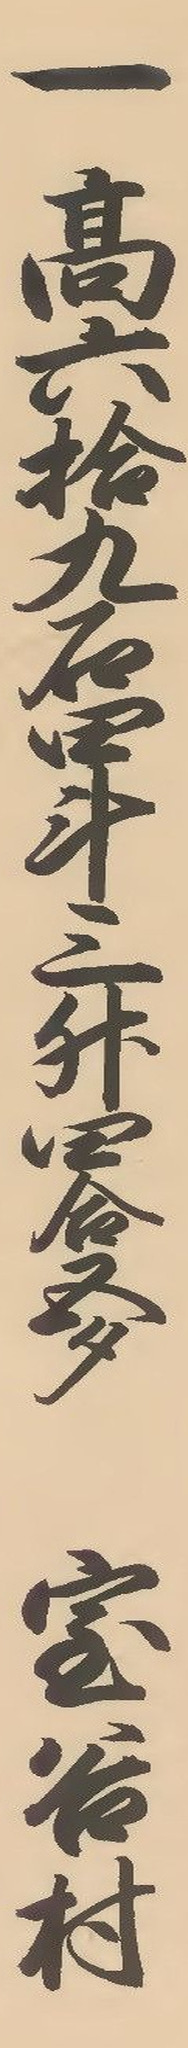一高六拾九石四斗三升四合五勺室谷村
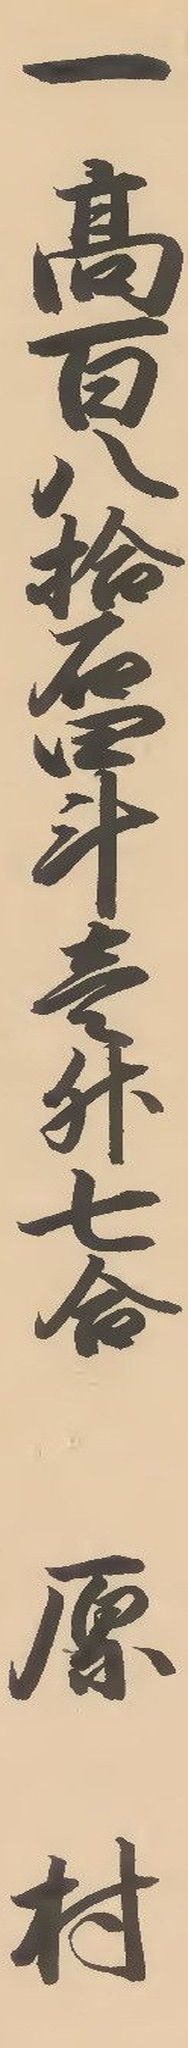一高百八拾石四斗壱升七合原村
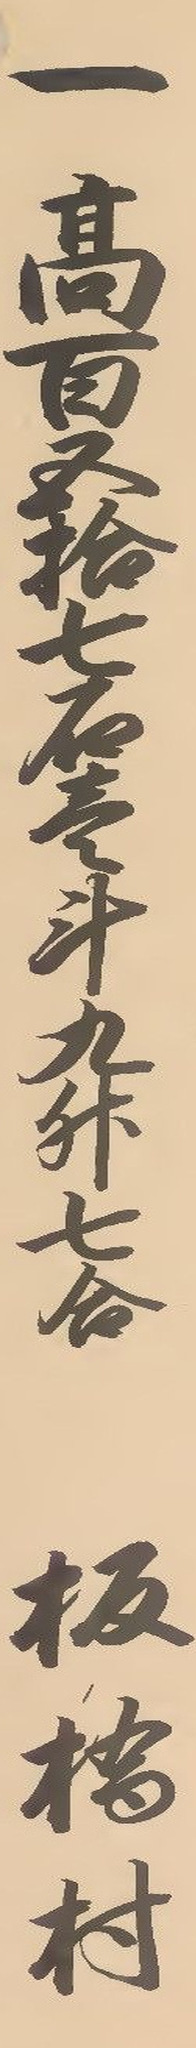一高百五拾七石壱斗九升七合板橋村
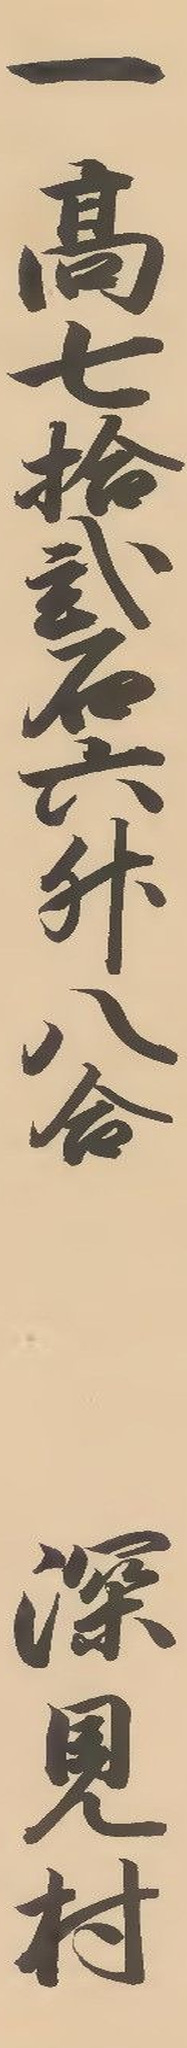一高七拾弐石六升八合深見村
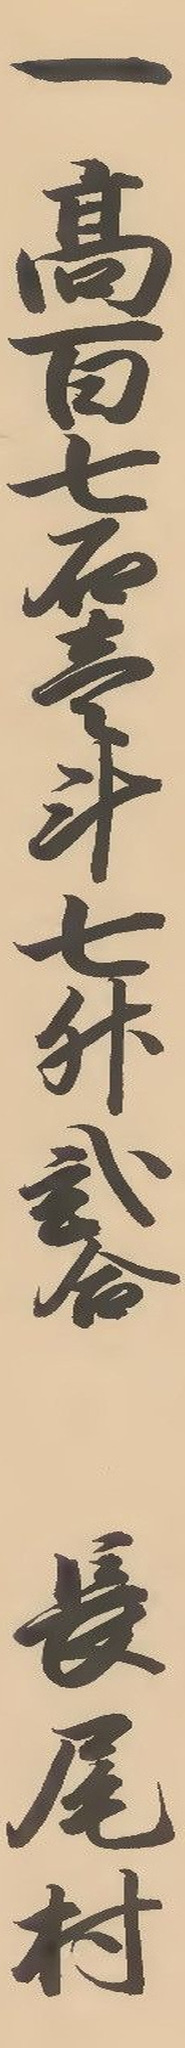一高百七石壱斗七升弐合長尾村
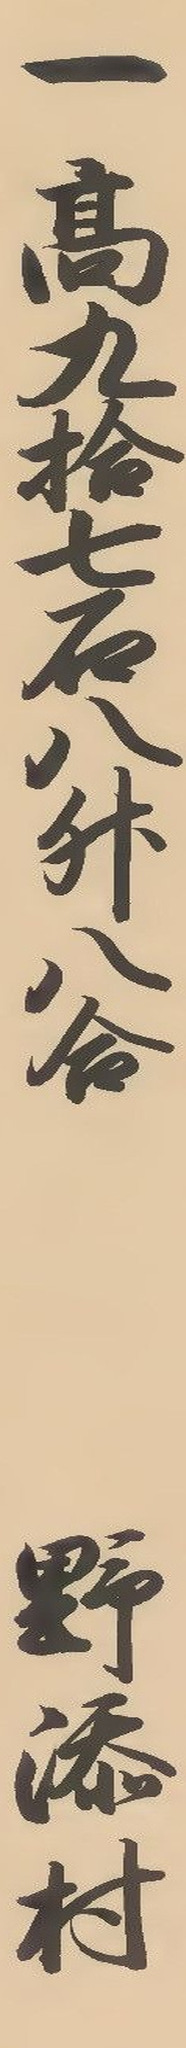一高九拾七石八升八合野添村
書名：丹波国郷帳
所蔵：国立公文書館 National Archives of Japan
